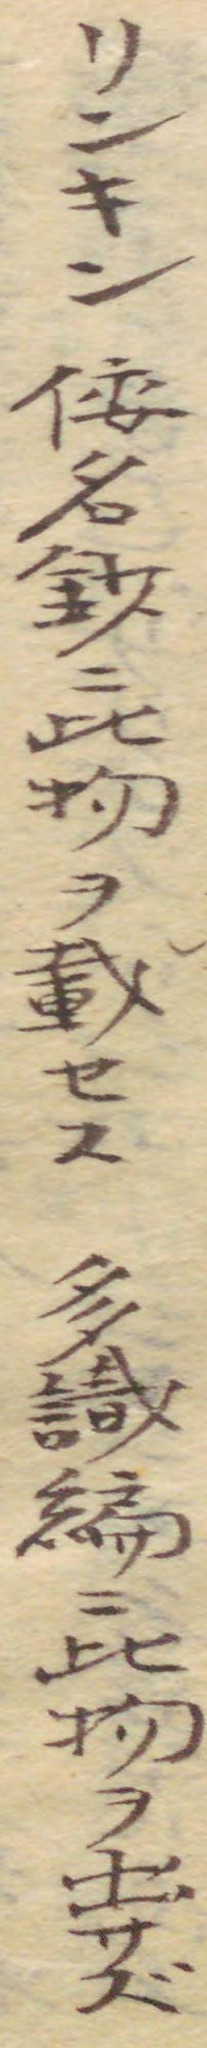リンキン倭名鈔ニ此物ヲ載セス多識編ニ此物ヲ出サズ
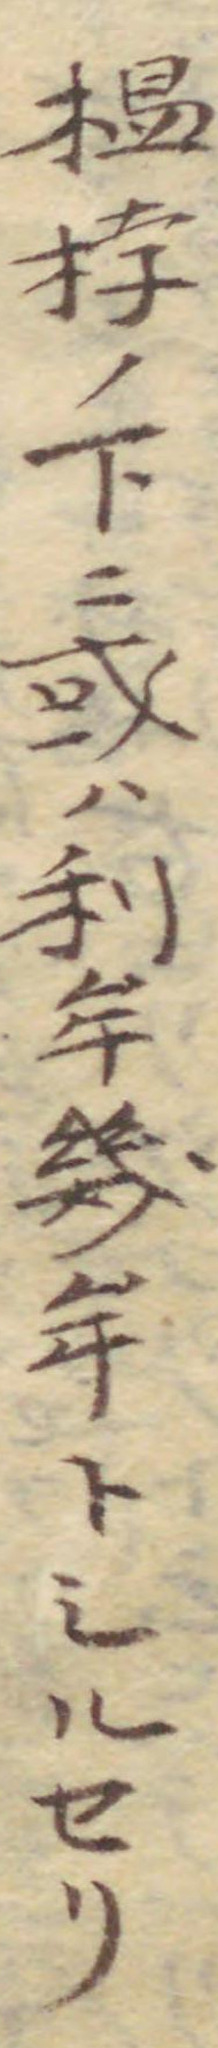榲桲ノ下ニ或ハ利牟幾牟トシルセリ
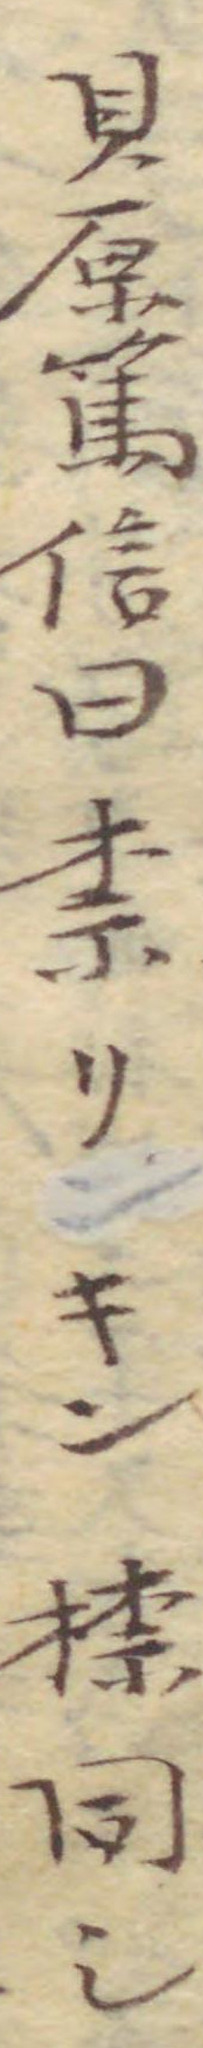貝原篤信曰柰リンキン㮏同シ
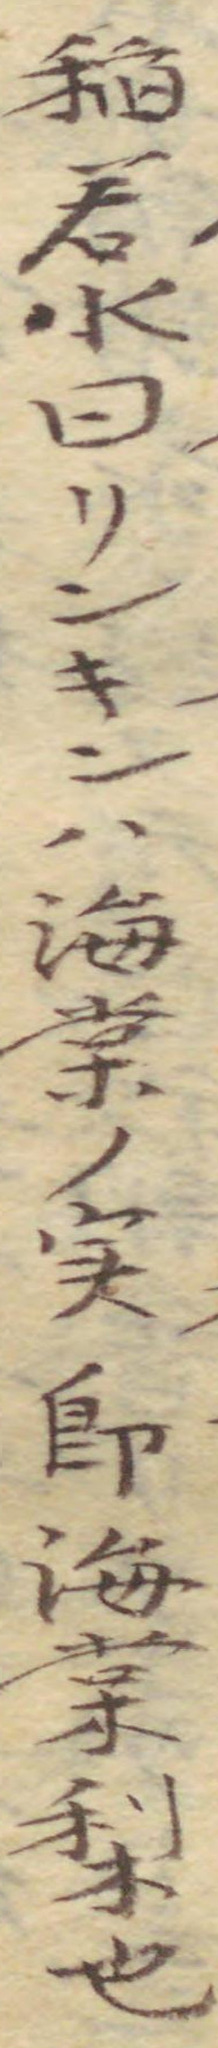稲若水曰リンキンハ海裳ノ実即海裳梨也
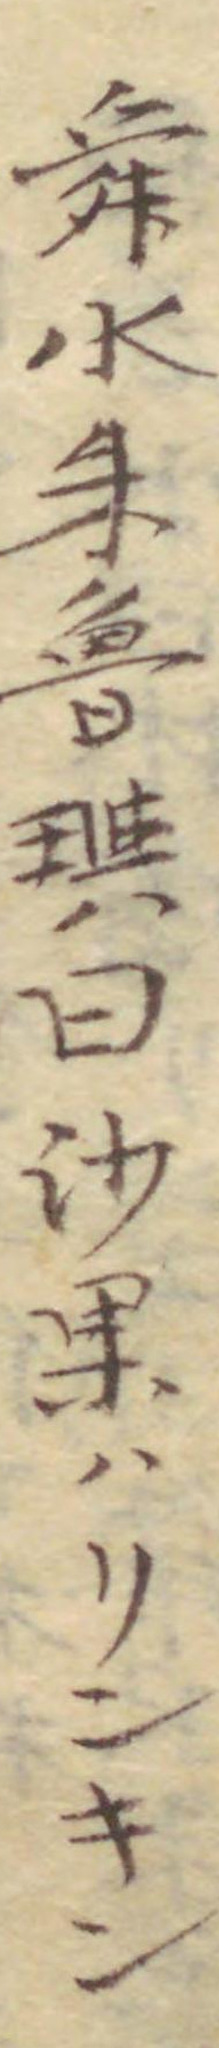舜水朱魯璵曰沙果ハリンキン
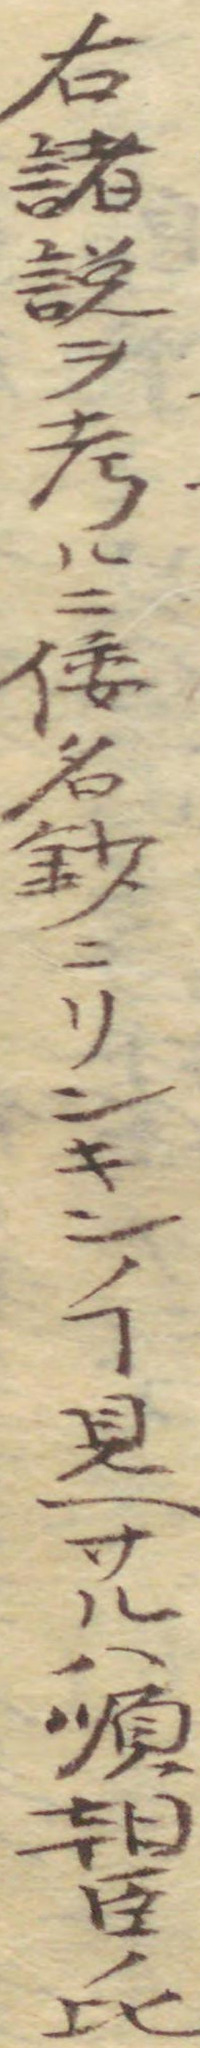右諸説ヲ考ルニ倭名鈔ニリンキンノコト見ヘサルハ順朝臣ノ比
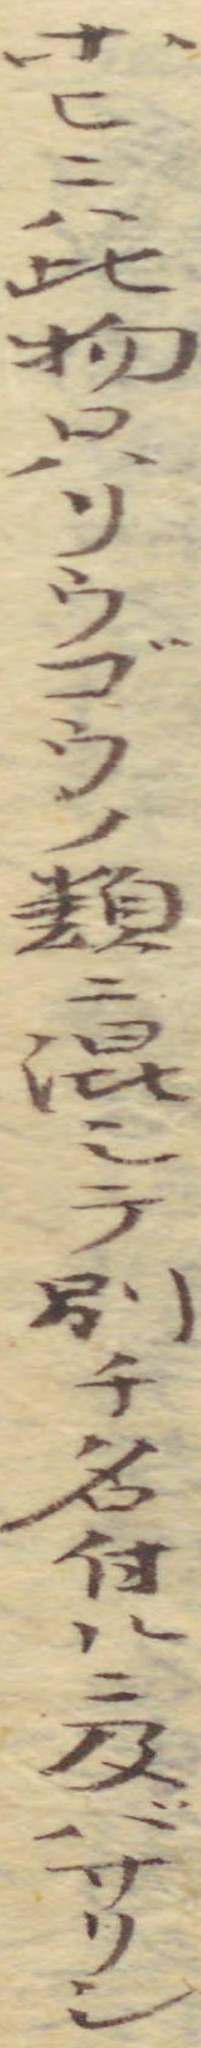ホヒニハ此物只リウゴウノ類ニ混シテ別チ名付ルニ及バサリシ
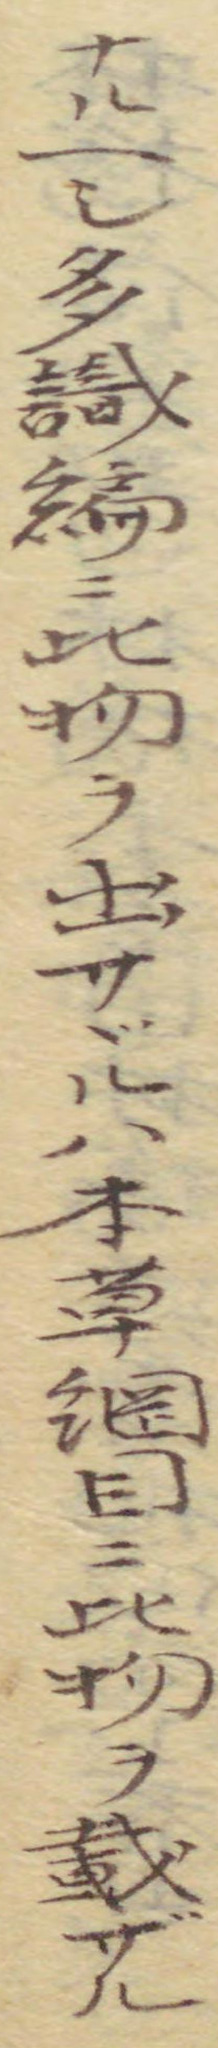ナルヘシ多識編ニ此物ヲ出サヾルハ本草綱目ニ此物ヲ載ザル
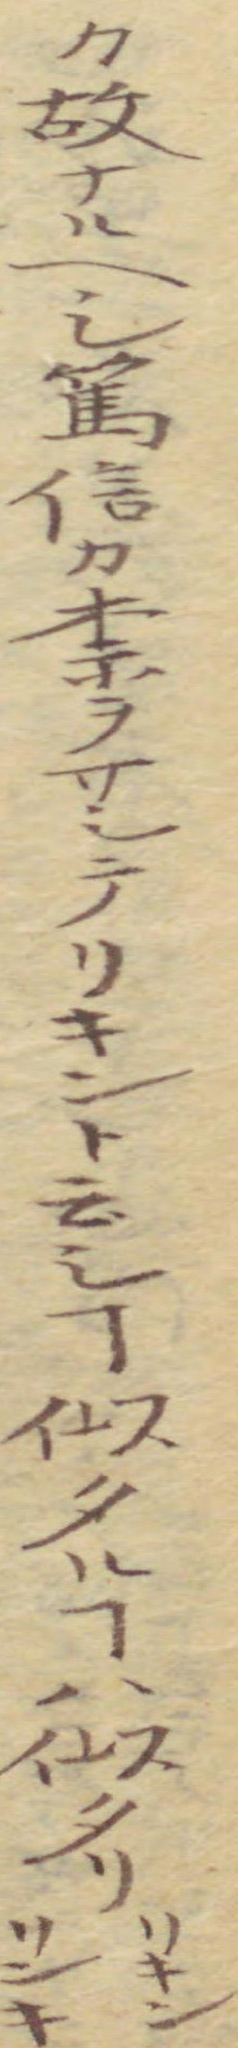カ故ナルヘシ篤信カ柰ヲサシテリキント云シコト似タルコトハ似タリリキンリンキ
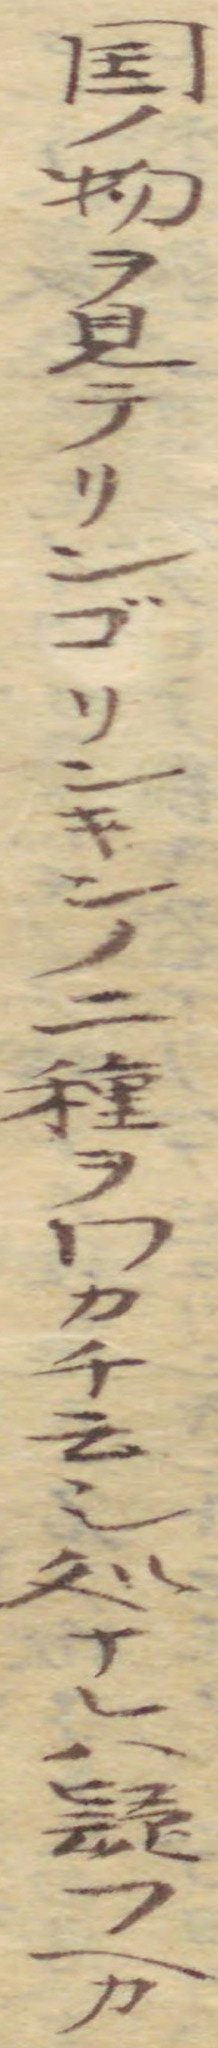国ノ物ヲ見テリンゴリンキンノ二種ヲワカチ云シ処ナレハ疑フヘカ
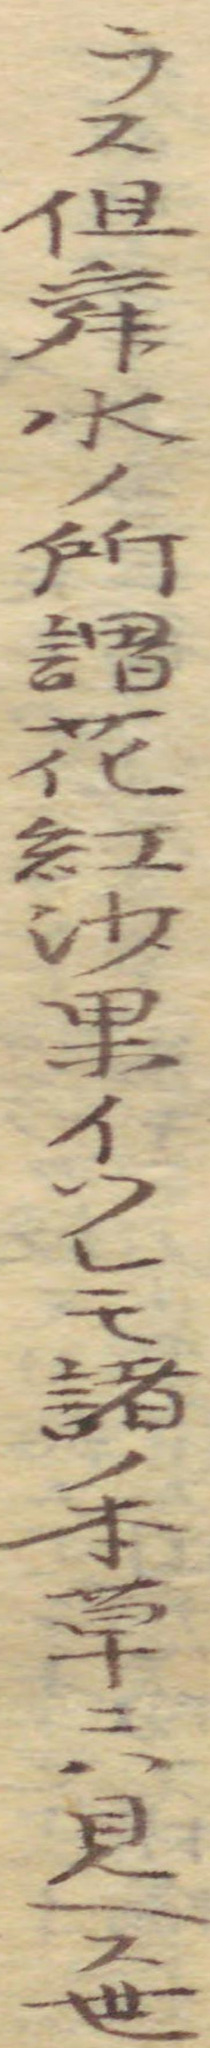ラス但舜水ノ所謂花紅沙果イツレモ諸ノ本草ニハ見ヘス世
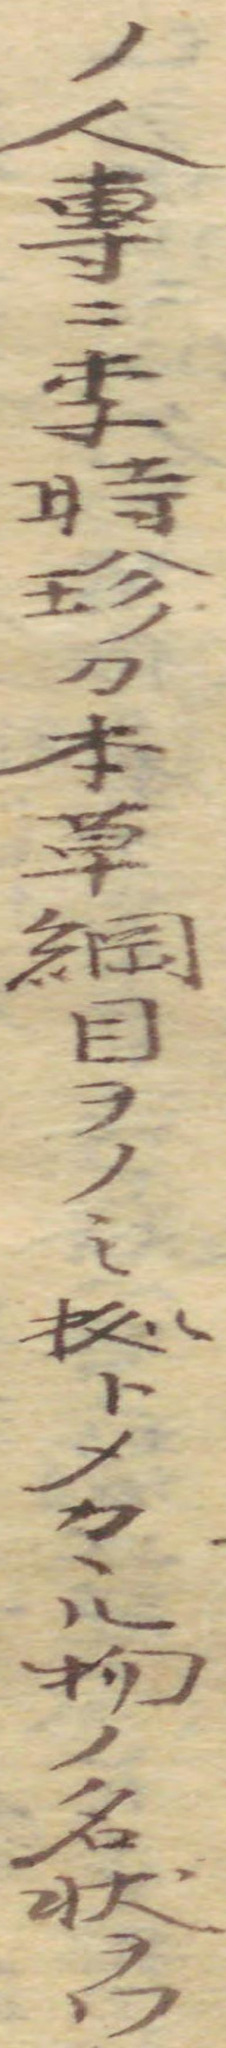ノ人専ニ李時珍カ本草綱目ヲノミ拠トシテカヽル物ノ名状ヲワ
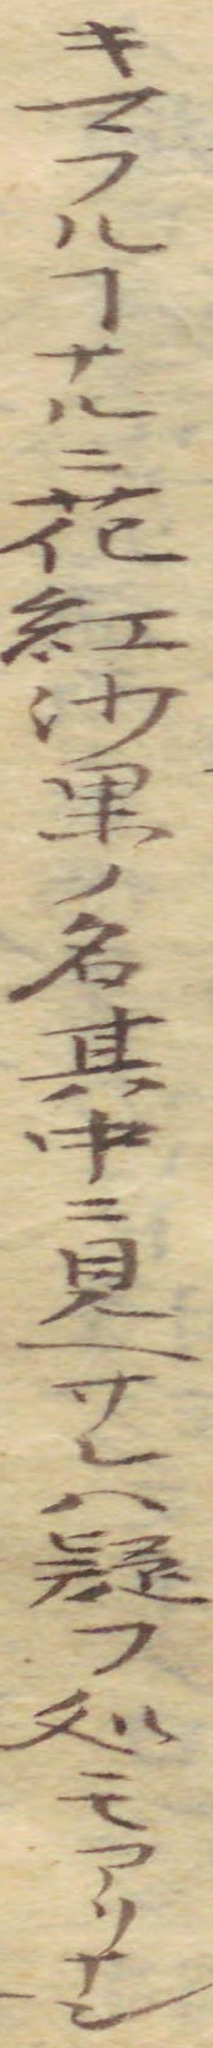キマフルコトナルニ花紅沙果ノ名其中ニ見ヘサレハ疑フ処モアリナン
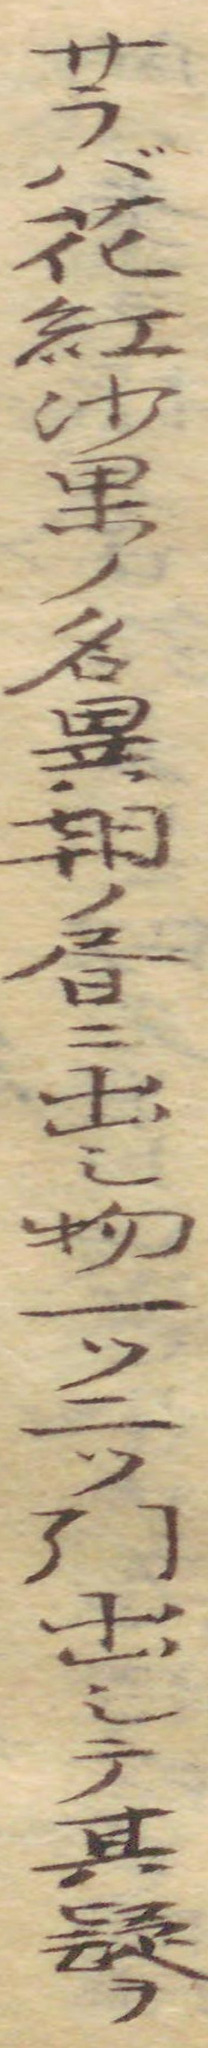サラバ花紅沙果ノ名異朝ノ書ニ出シ物一ツ二ツ引出シテ其疑ヲ
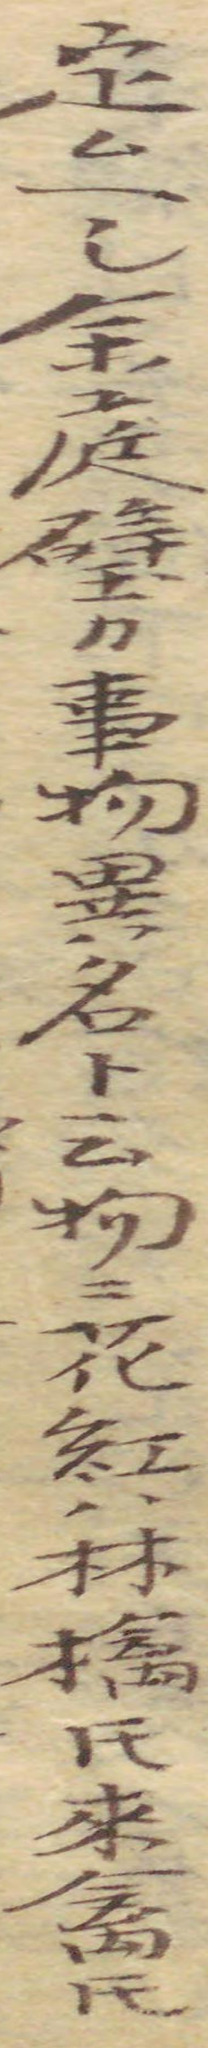定ムヘシ余庭璧カ事物異名ト云物ニ花紅ハ林檎トモ来禽トモ
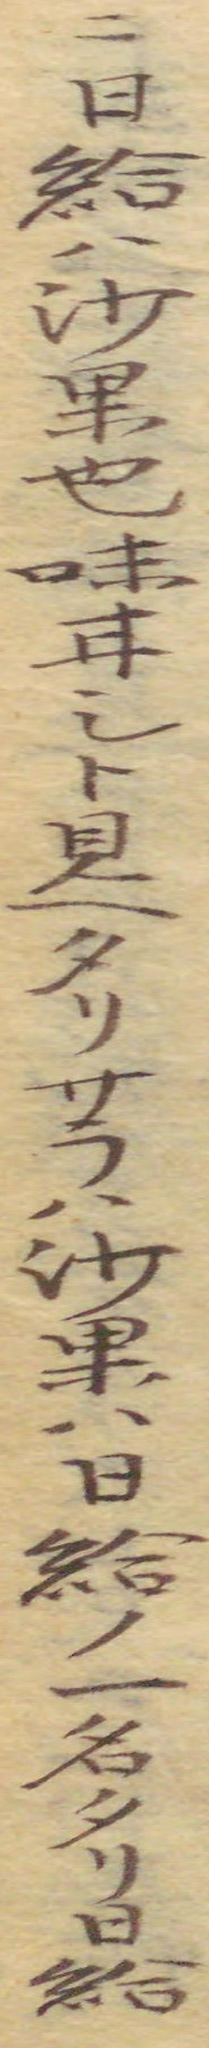ニ日給ハ沙果也味甘シト見ヘタリサラハ沙果ハ日給ノ一名タリ日給
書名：鶯宿雑記. 巻263-264
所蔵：国立国会図書館 National Diet Library, JAPAN
